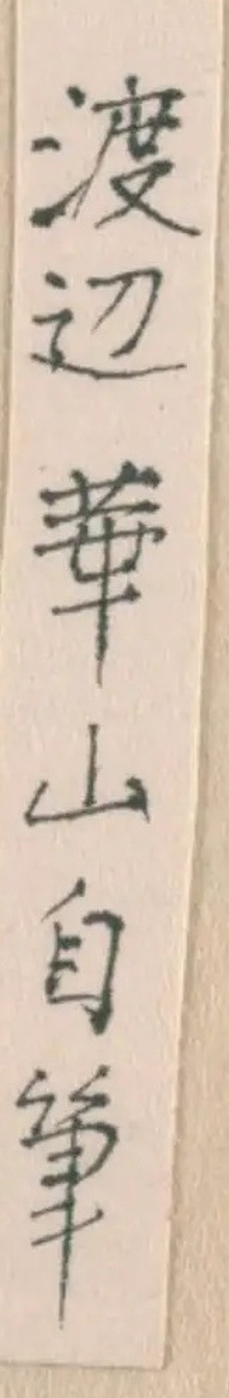渡辺華山自筆

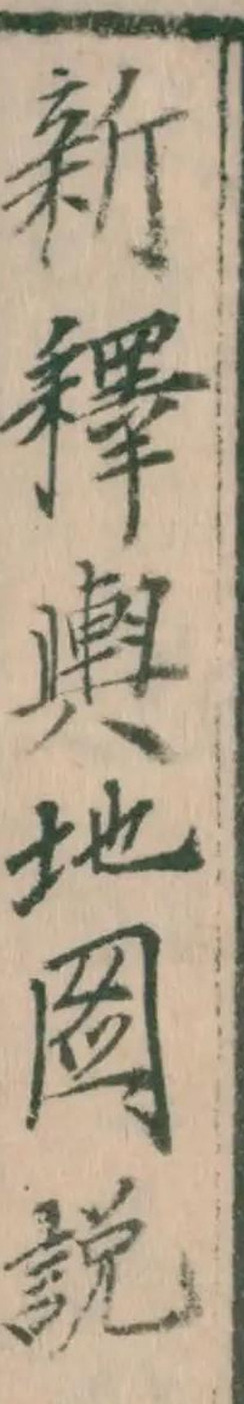新釈輿地図説
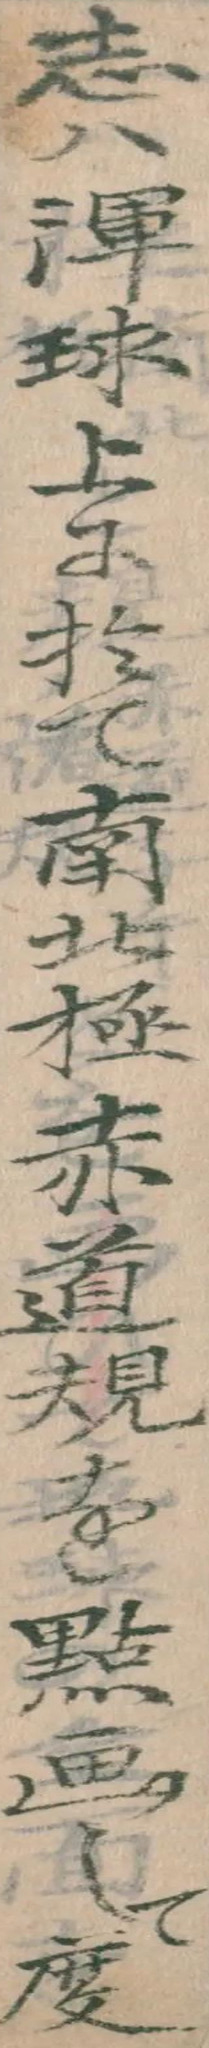志は渾球上に於て南北極赤道規を点画して度
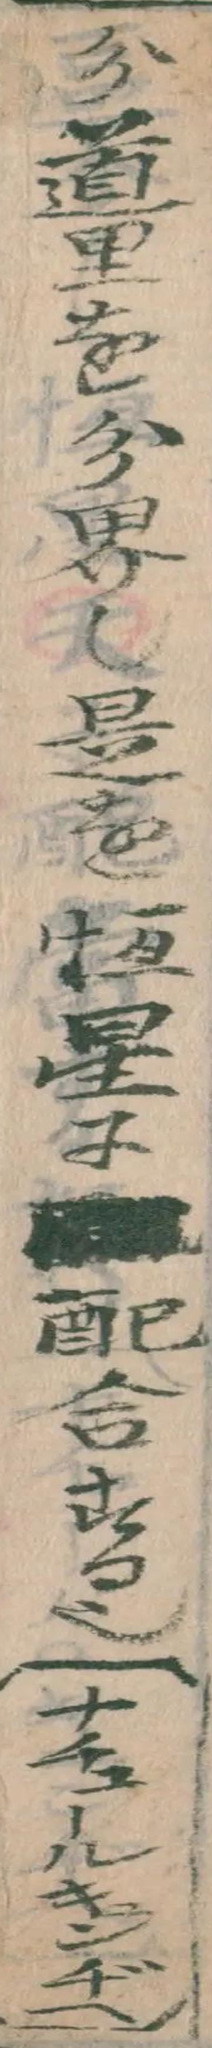分道里を分界し是を恒星に配合する也(ナチュールキュンヂヘ)
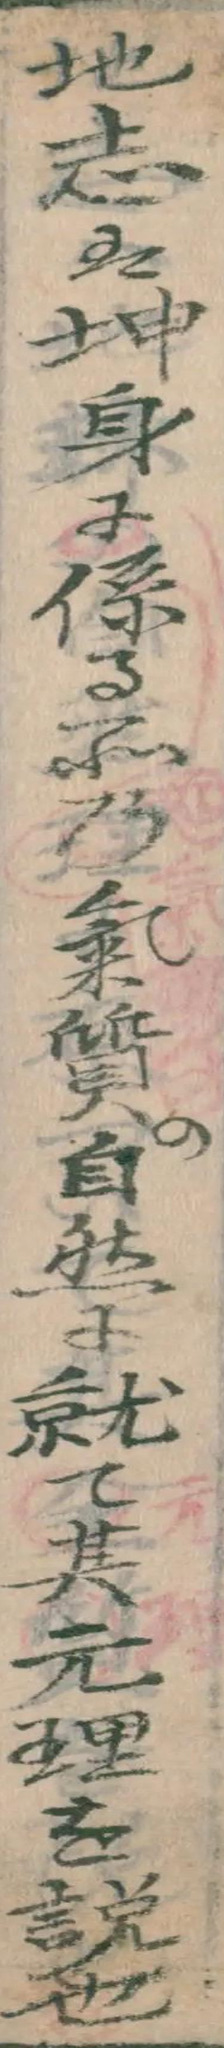地志は坤身に係る所の気質の自然に就て其元理を説也
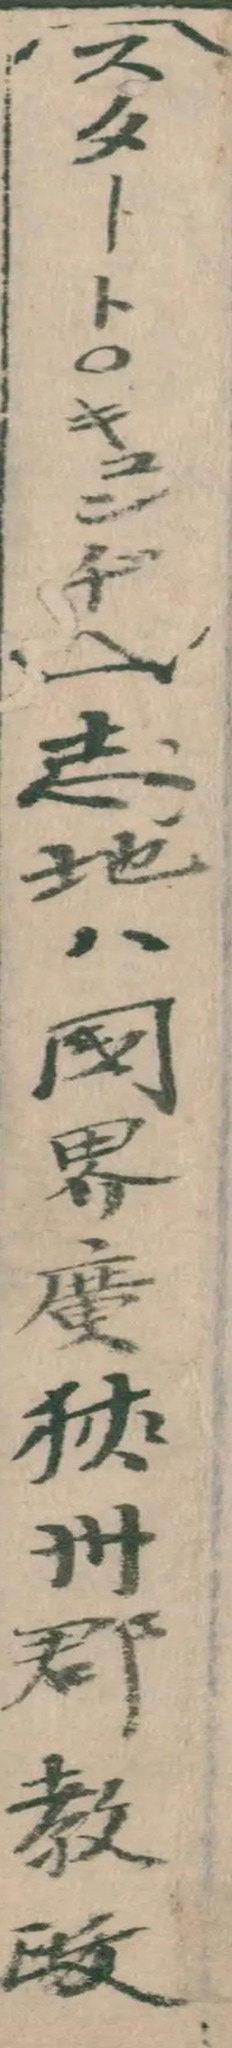(スタート・キュンヂヘ)志地は国界広狭州郡教政

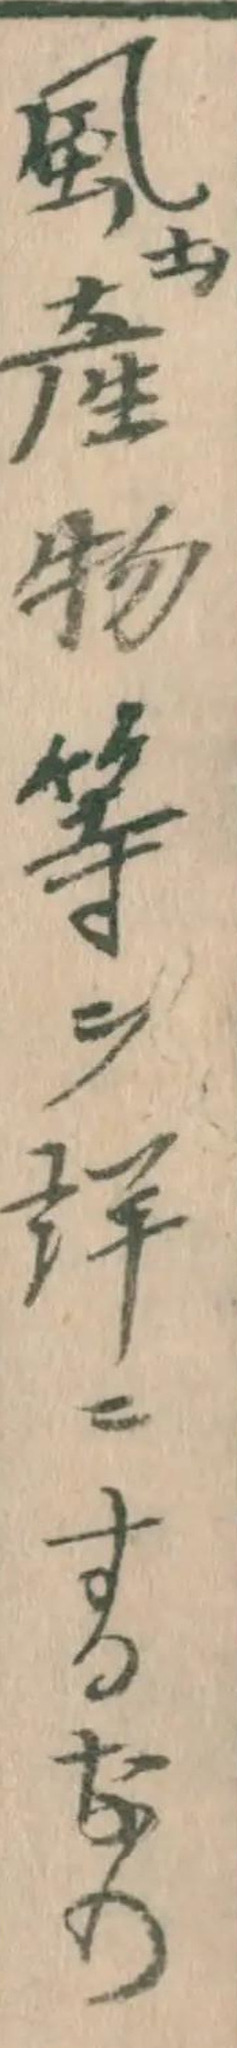風土産物等ヲ詳ニするなり
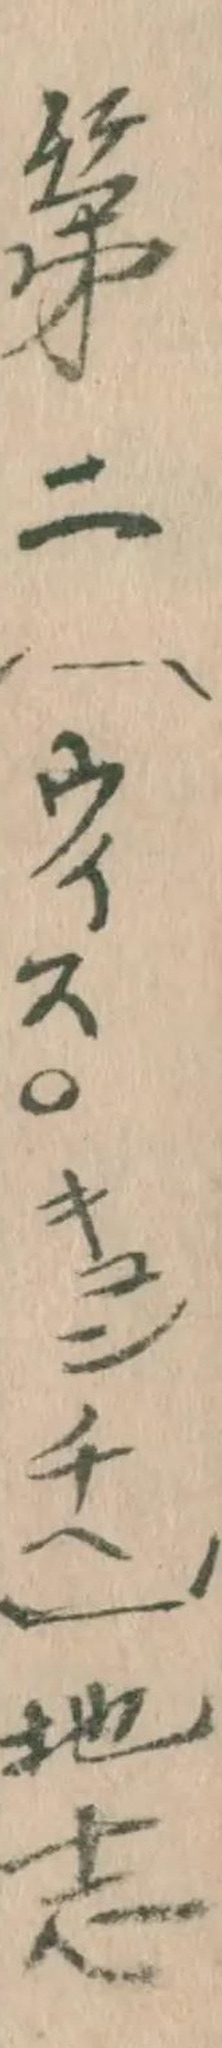第二(ウィス・キュンチヘ)地志
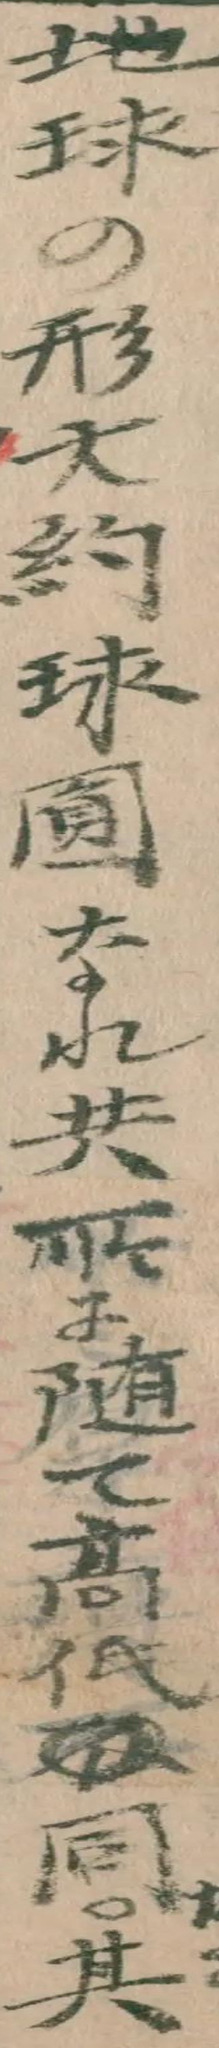地球の形大約球円なれ共所に随て高低同からす其
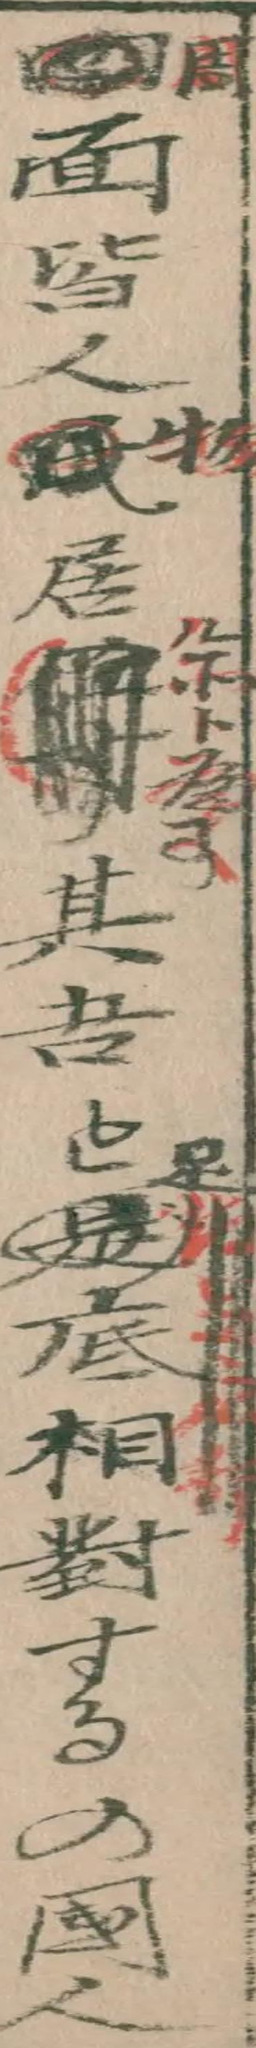周面皆人物居ル所トなす其吾と足底相対するの国人
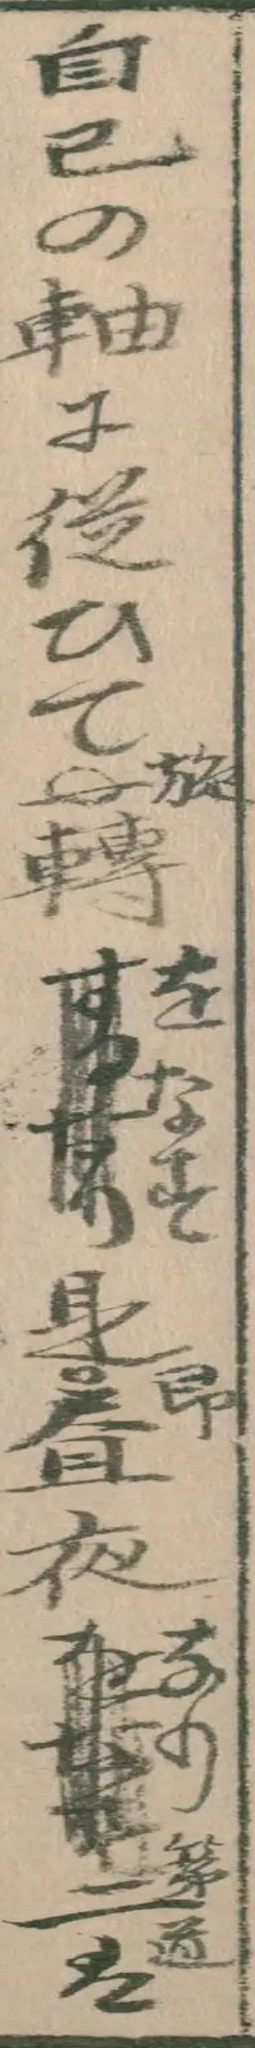自己の軸に従ひて旋転をなす是即昼夜なり第二道は
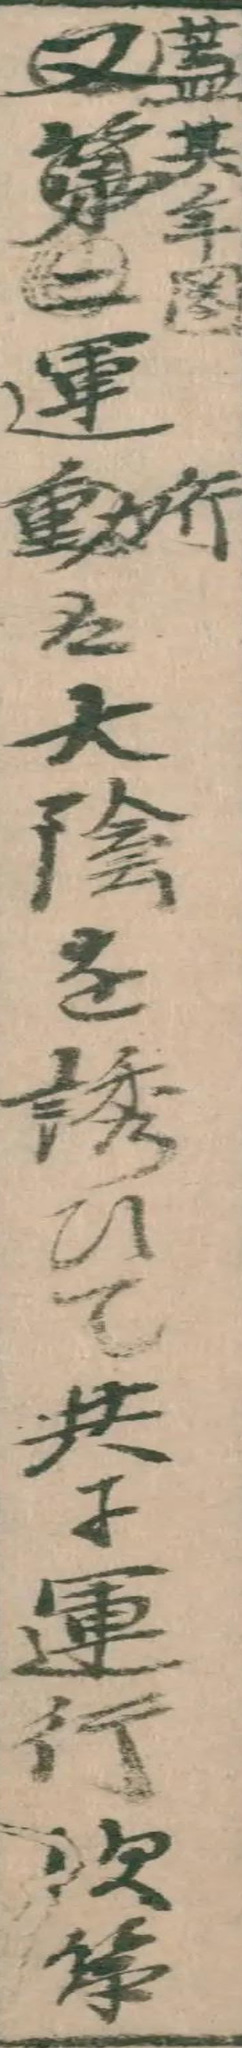蓋其年圏運行は大陰を誘ひて共に運行す第
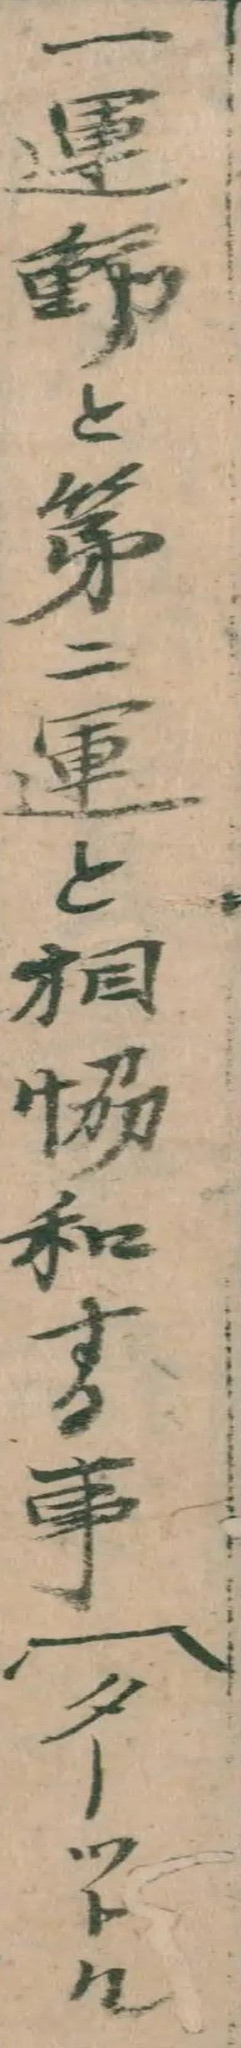一運動と第二運動と相協和する事(ターツトル
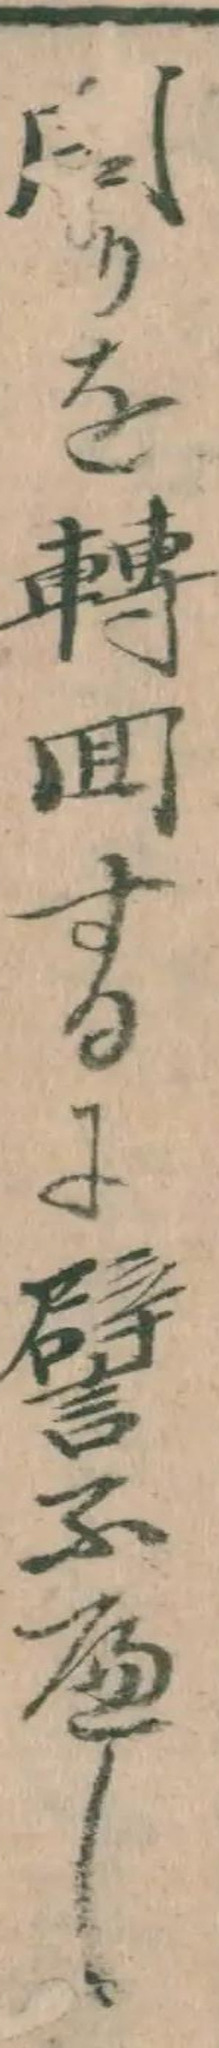周りを転回するに譬ふへし
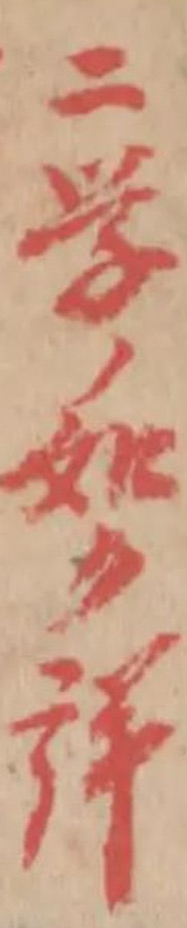ニ学ノ如ク詳
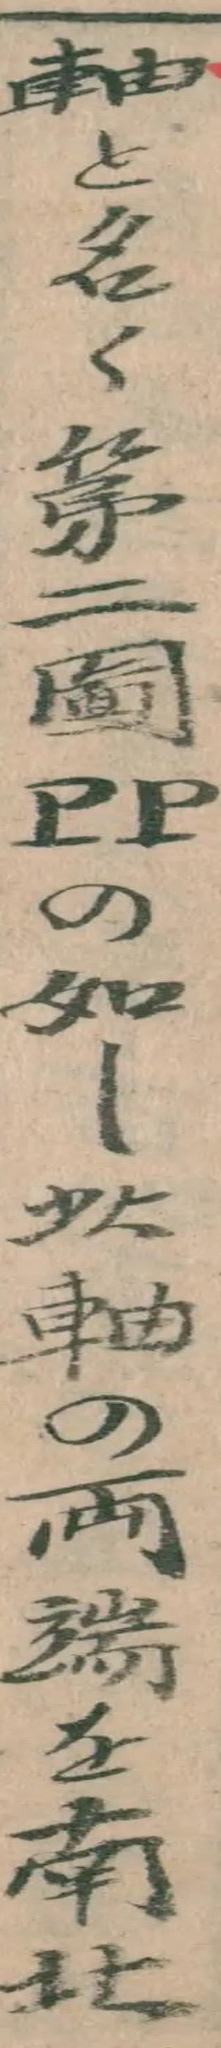軸と名く第二円の如し此軸の両端を南北
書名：新釈輿地図説
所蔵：国立国会図書館 National Diet Library, JAPAN
